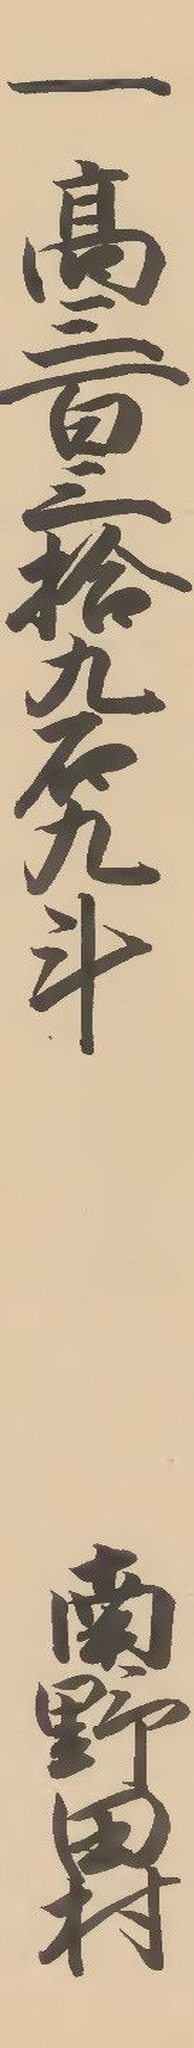一高三百三拾九石九斗南野田村
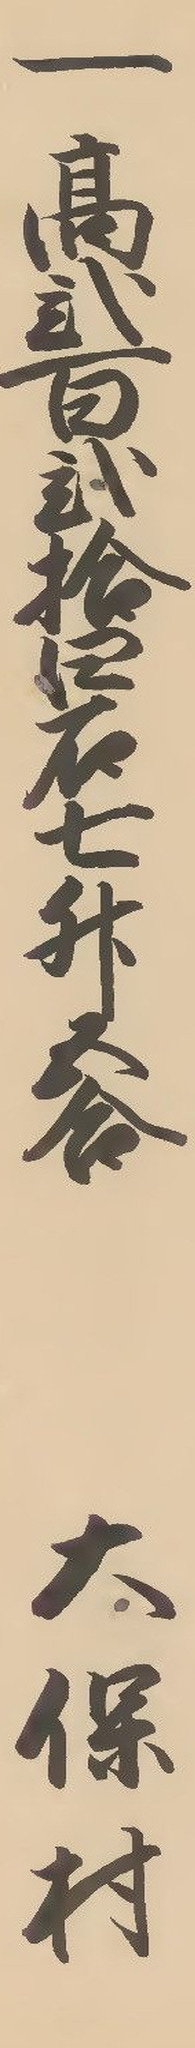一高弐百弐拾四石七升五合大保村

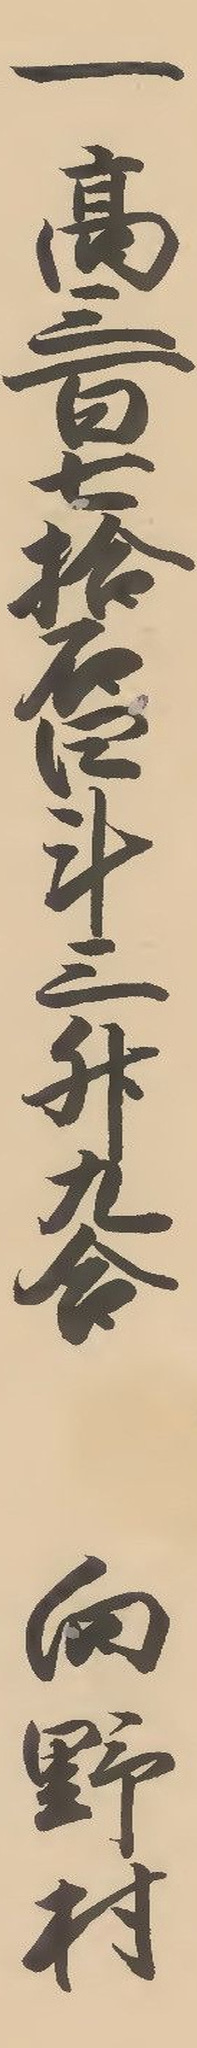一高三百七拾石四斗三升九合向野村
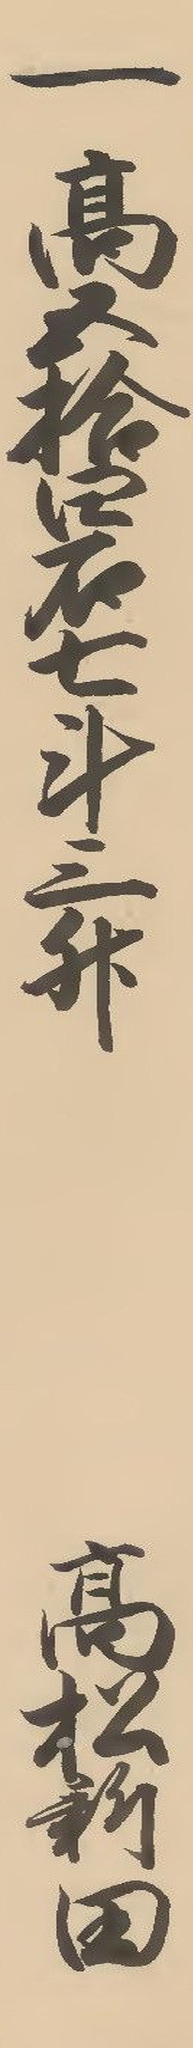一高五拾四石七斗三升高松新田
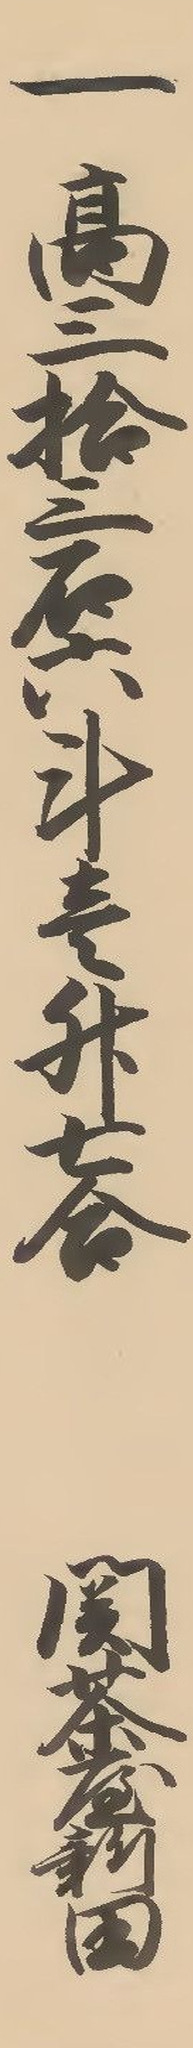一高三拾三石六斗壱升七合関茶屋新田
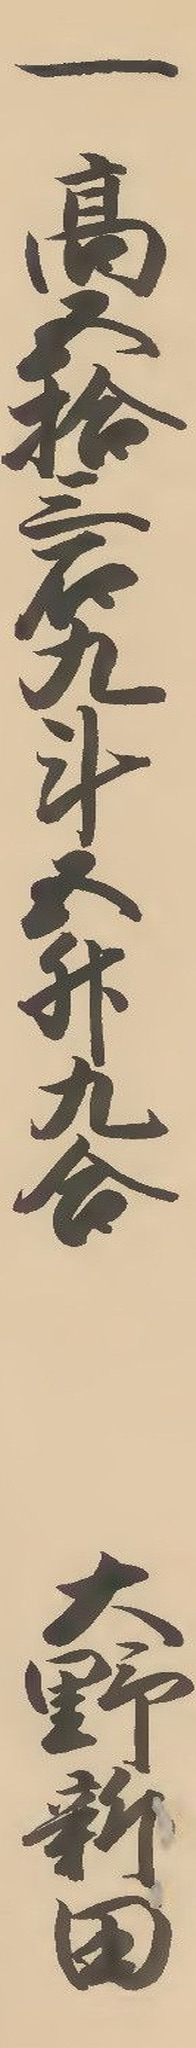一高五拾三石九斗五升九合大野新田
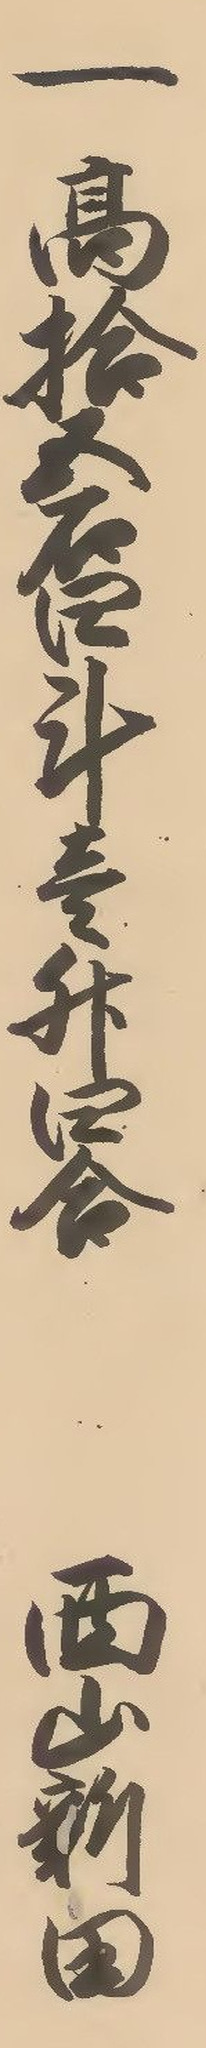一高拾五石四斗壱升四合西山新田
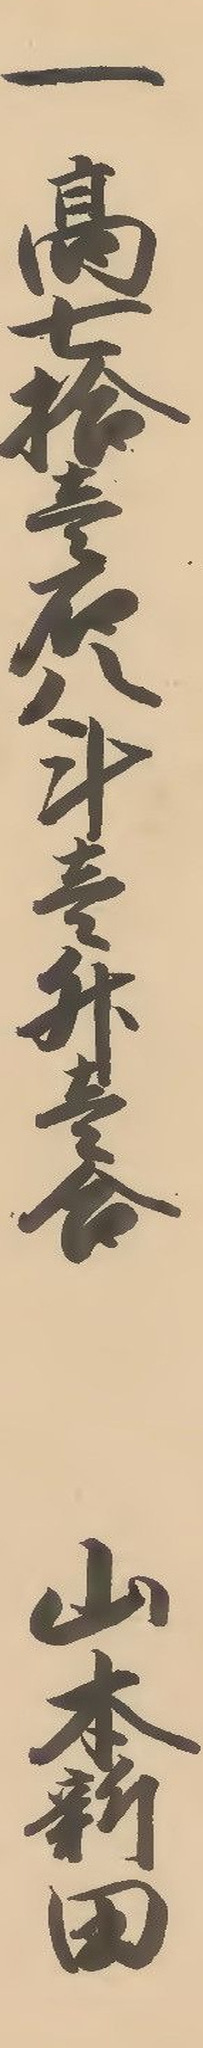一高七拾壱石八斗壱升壱合山本新田
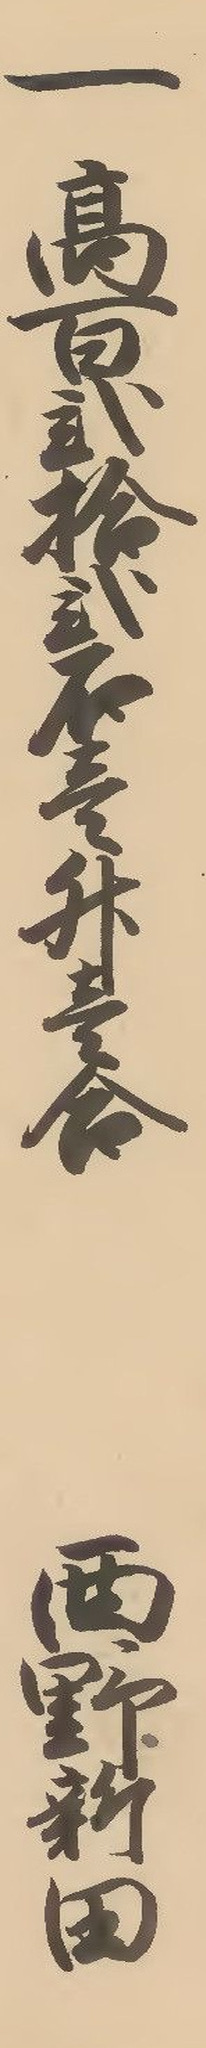一高百弐拾弐石壱升壱合西野新田
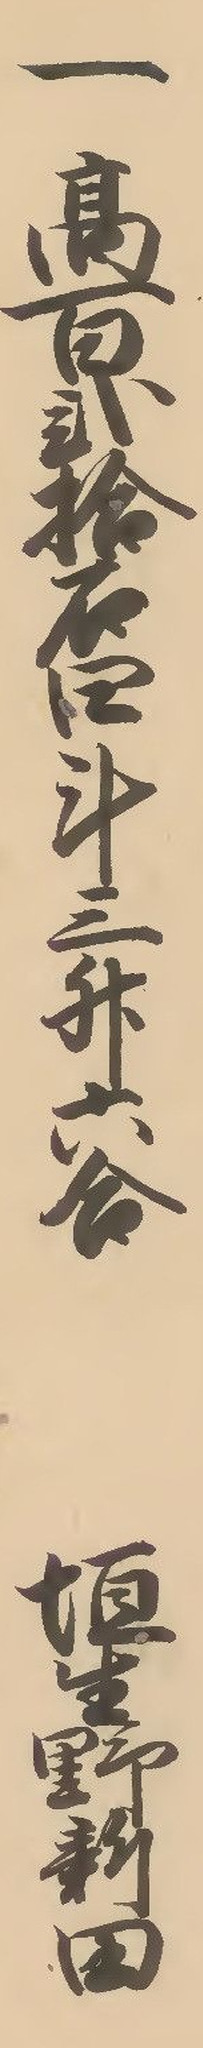一高百弐拾石四斗三升六合垣生野新田

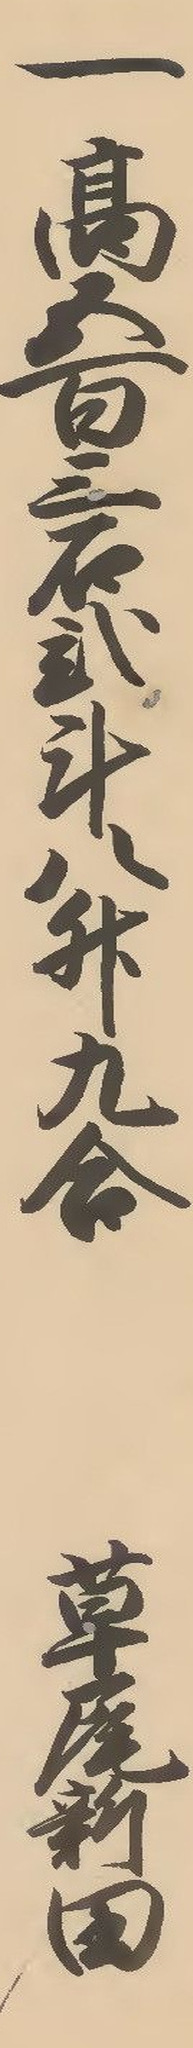一高五百三石弐斗八升九合草尾新田
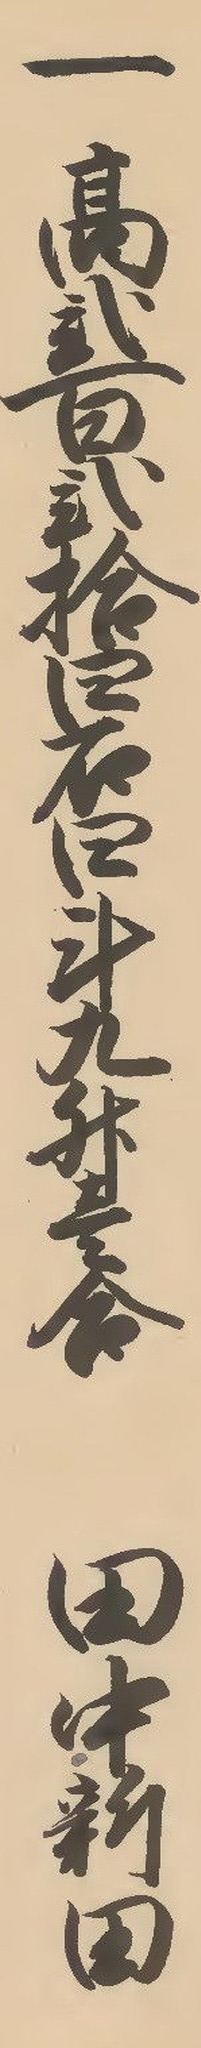一高弐百弐拾四石四斗九升壱合田中新田
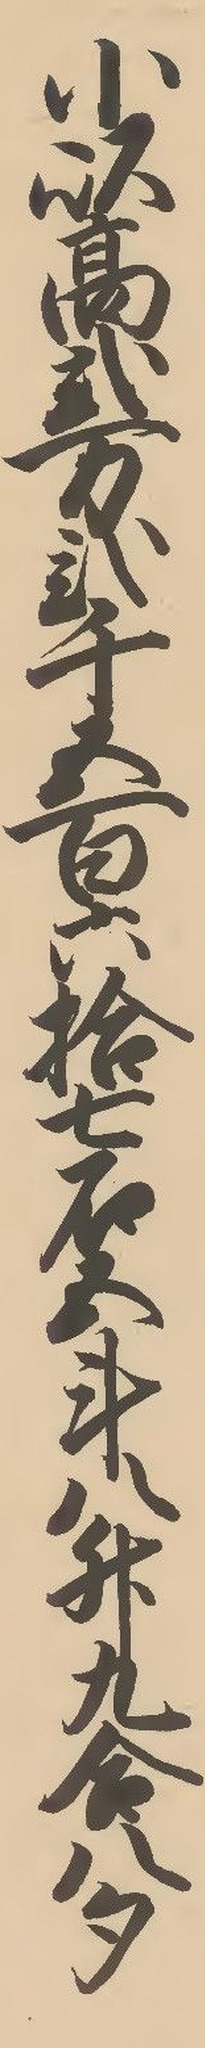小以高弐万弐千五百六拾七石五斗八升九合八勺
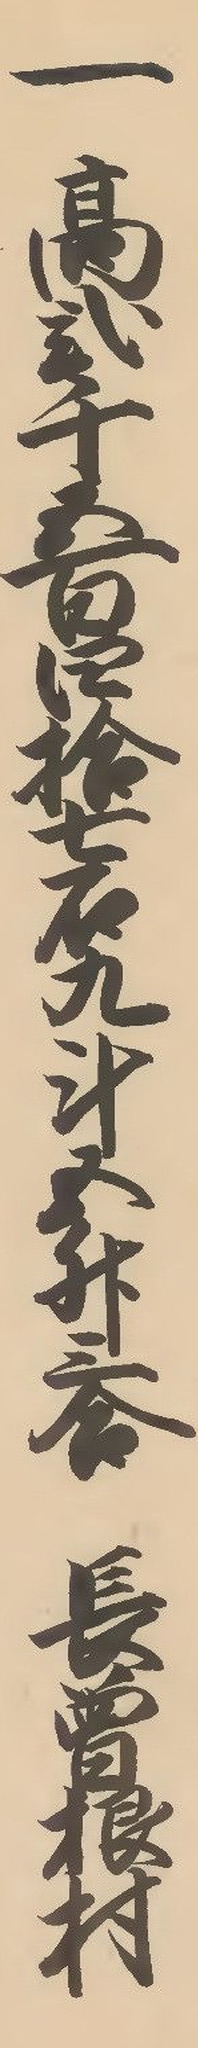一高弐千五百四拾七石九斗五升三合長曽根村
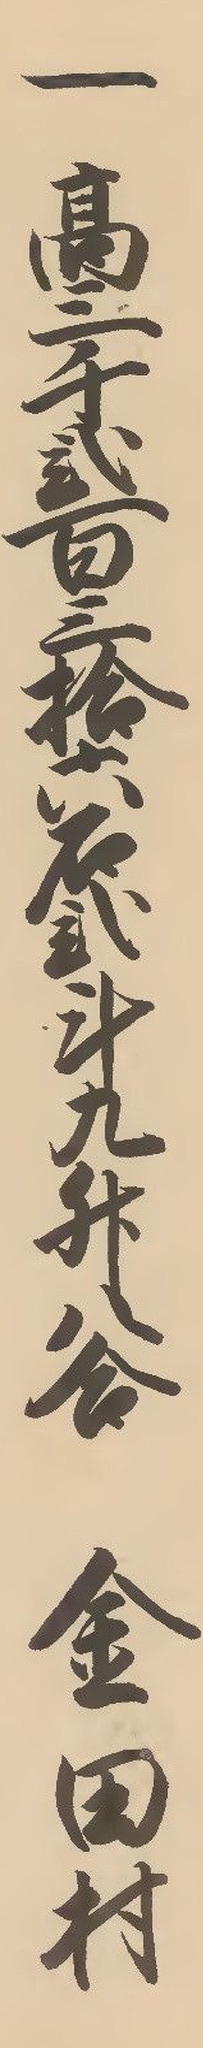一高三千弐百三拾六石弐斗九升八合金田村
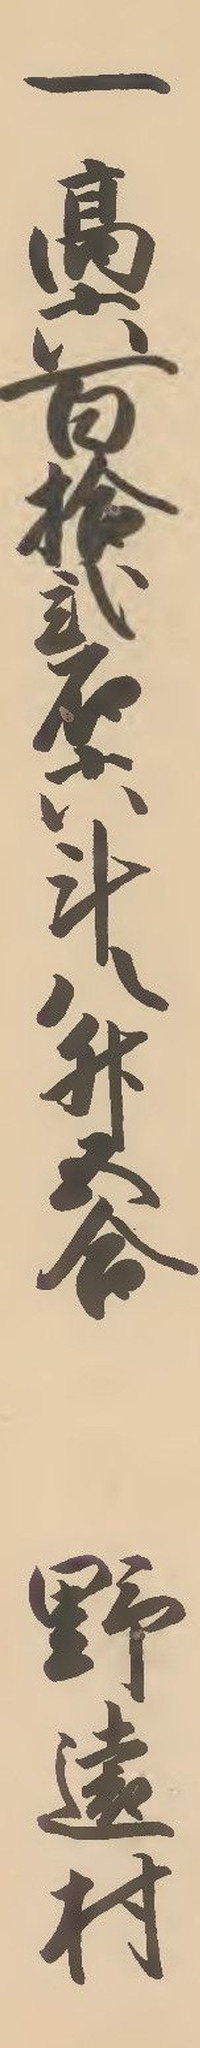一高六百拾弐石六斗八升五合野遠村
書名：河内国郷帳
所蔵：国立公文書館 National Archives of Japan
